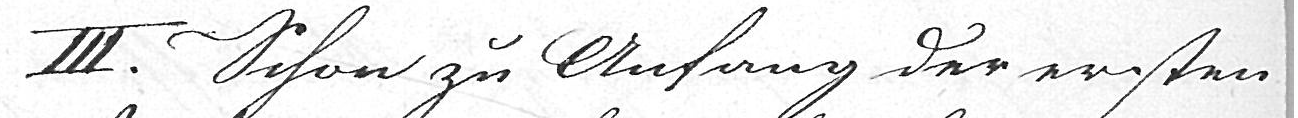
III. Schon zu Anfang der ersten
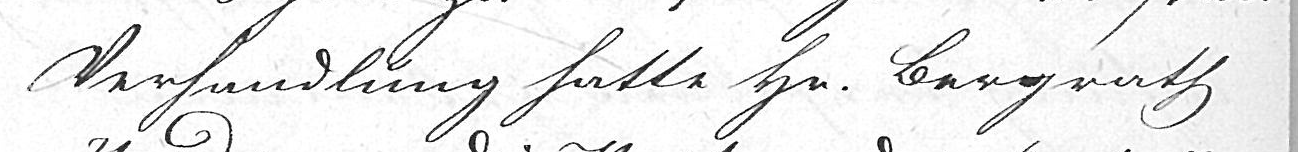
Verhandlung hatte Hr. Bergrath
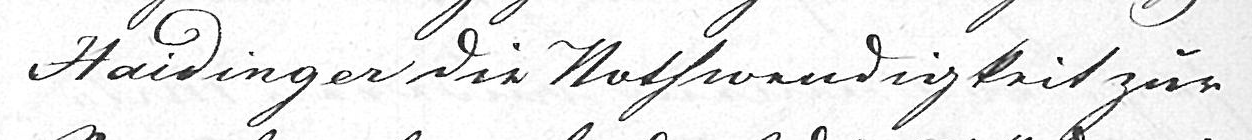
Haidinger die Nothwendigkeit zur
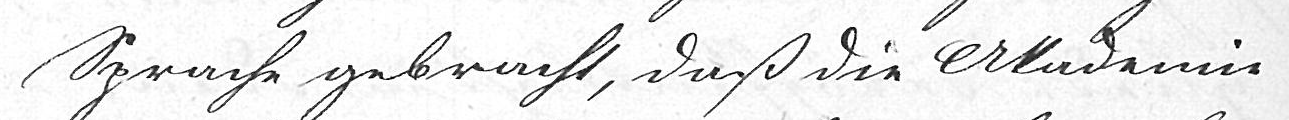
Sprache gebracht, daß die Akademie
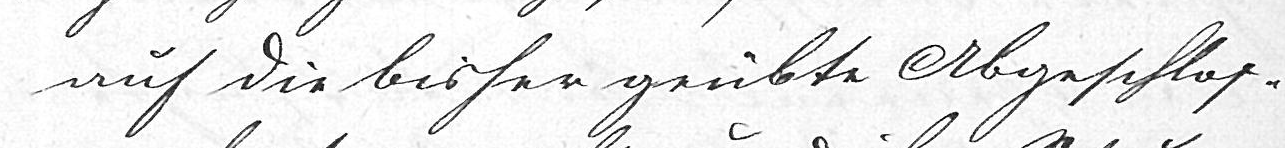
auf die bisher geübte Abgeschlos-
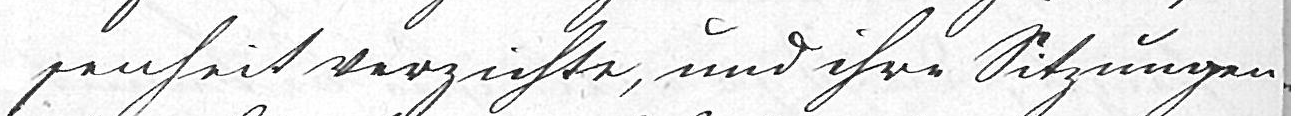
senheit verzichte, und ihre Sitzungen
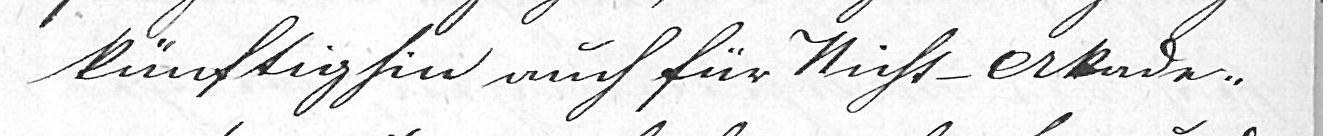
künftighin auch für Nicht Akade-
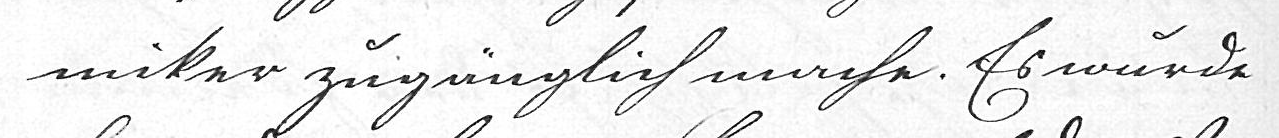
miker zugänglich mache. Es wurde
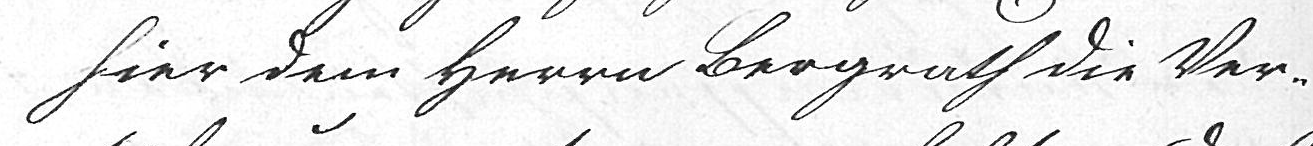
hier dem Herrn Bergrath die Ver-
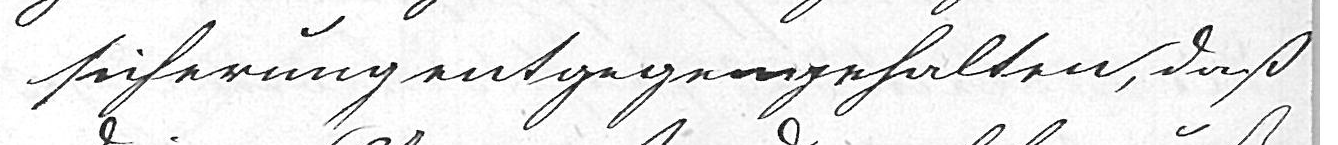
sicherung entgegen gehalten, daß
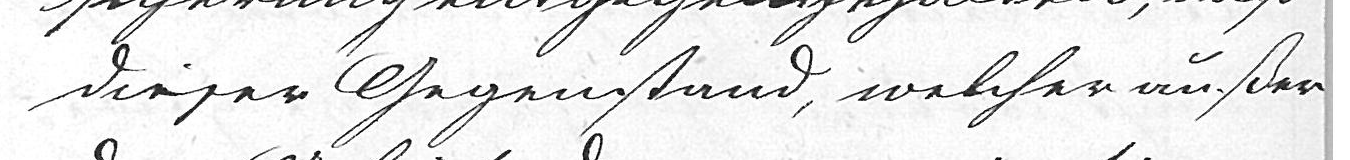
dieser Gegenstand, welcher außer
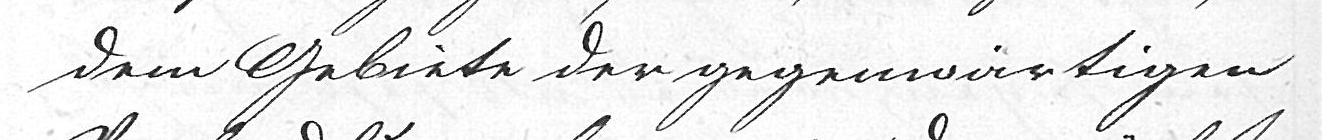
dem Gebiete der gegenwärtigen
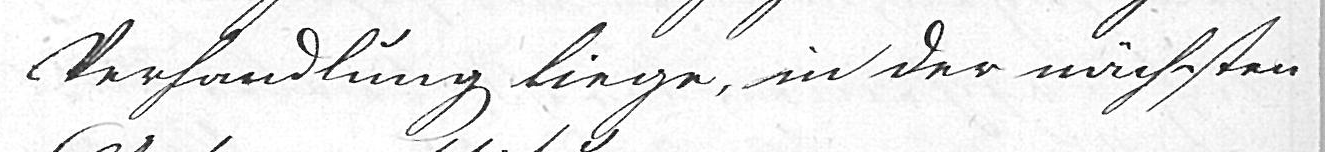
Verhandlung liege, in der nächsten
